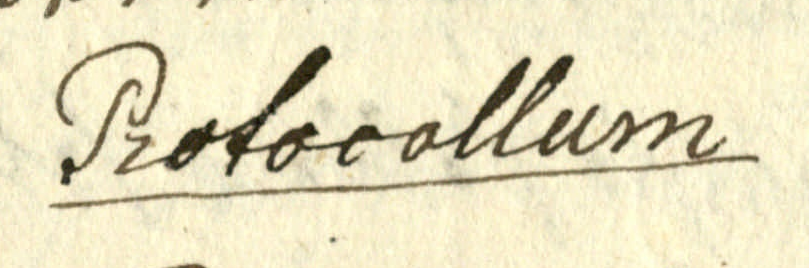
Protocollum
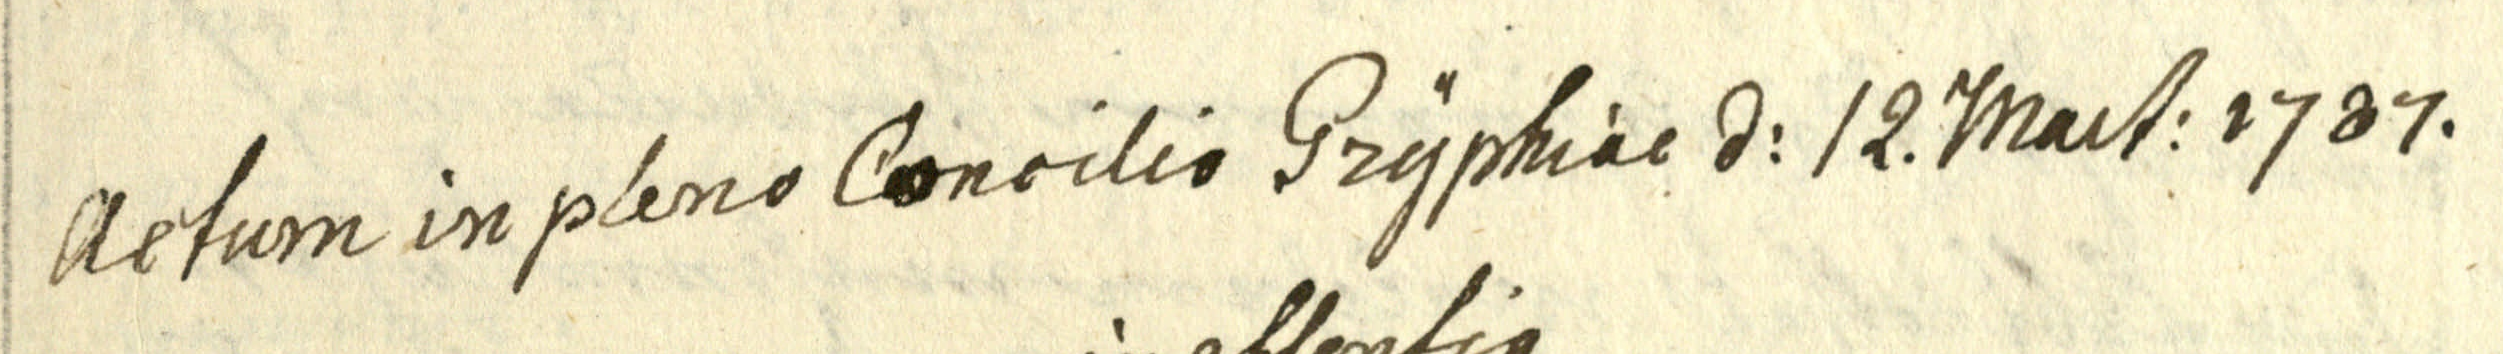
Actum in pleno Concilio Grÿphiae d. 12. Mart. 1787.
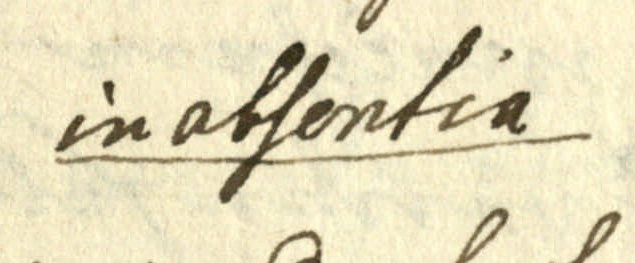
in absentia
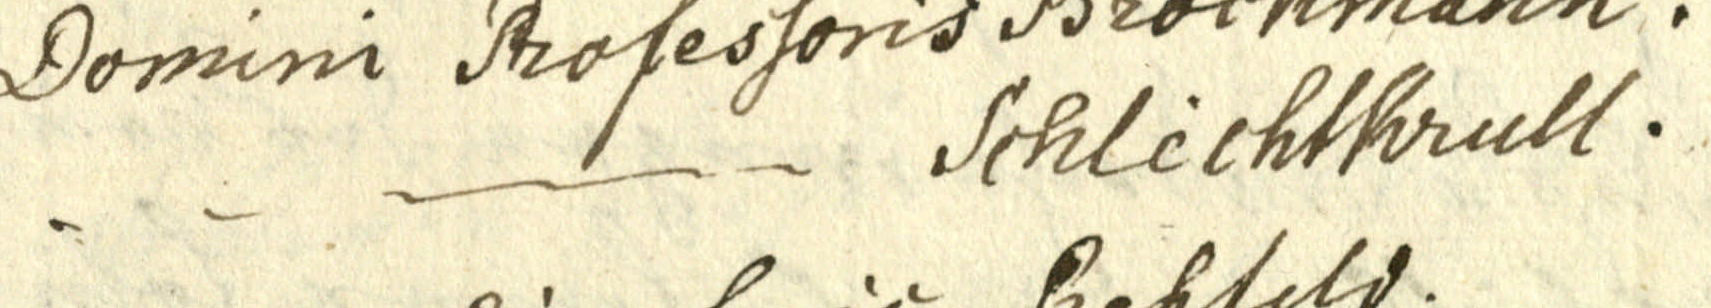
Schlichtkrull.
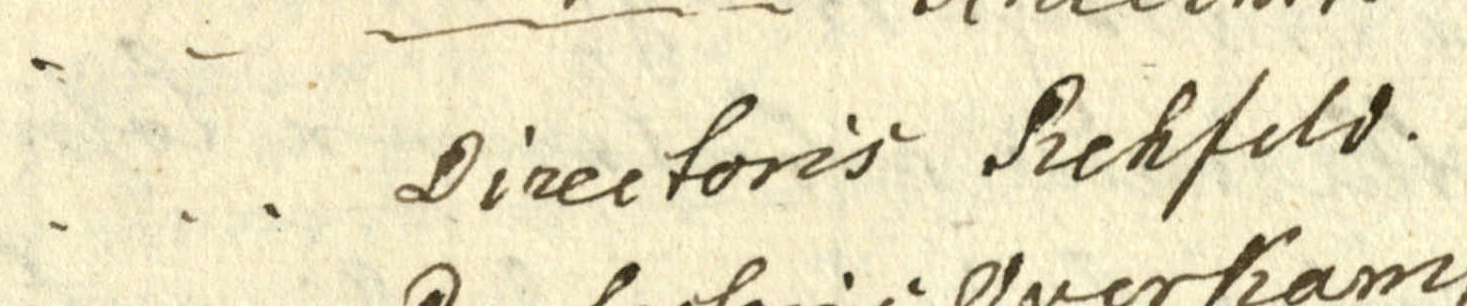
Directoris Rehfeld.
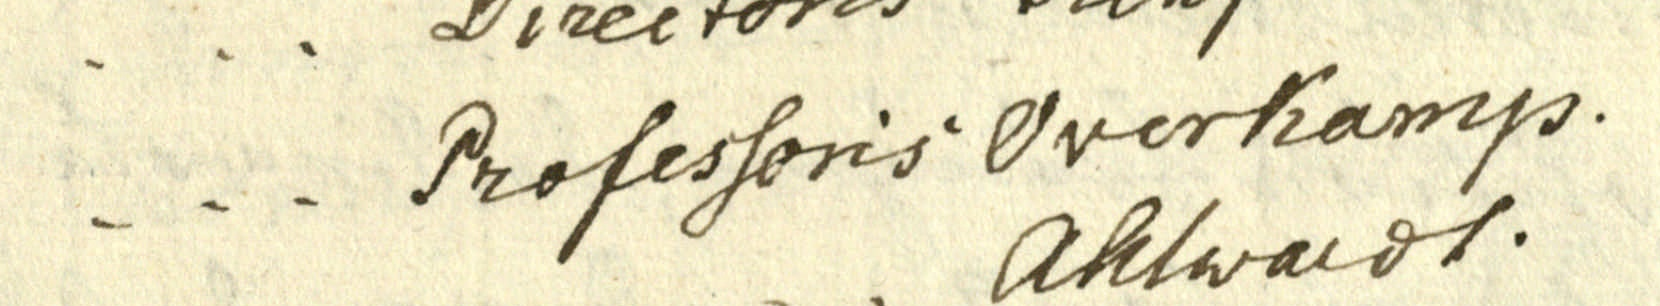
Professoris Overkamp.
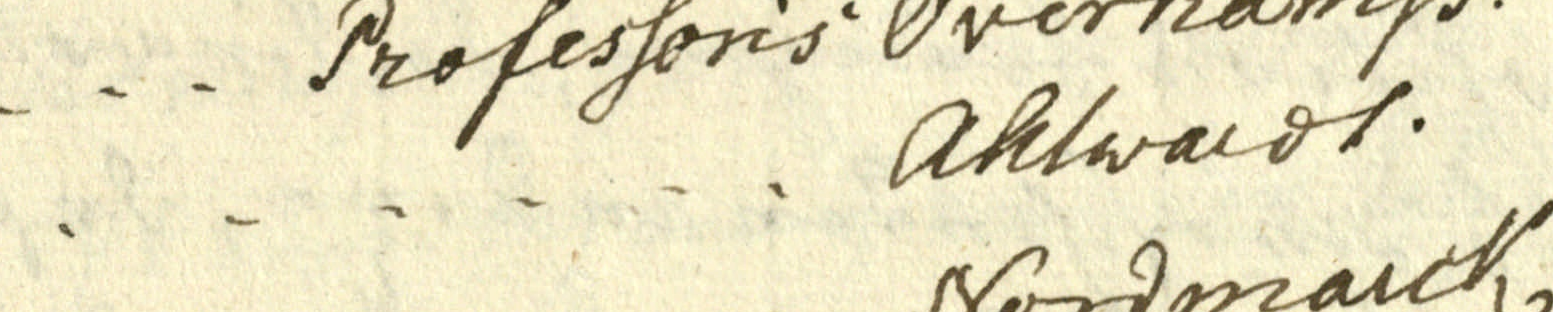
Ahlwardt.
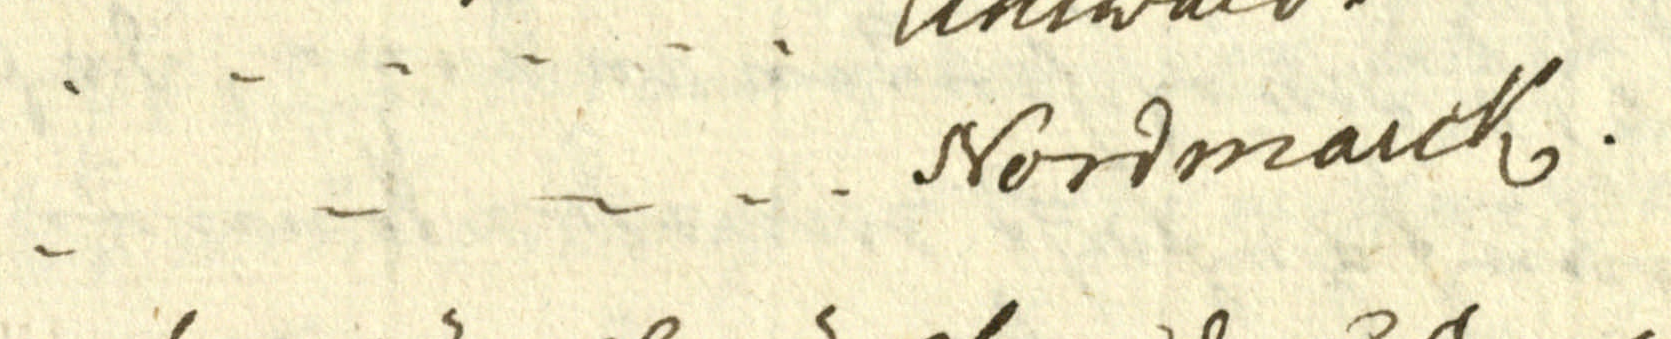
Nordmarck
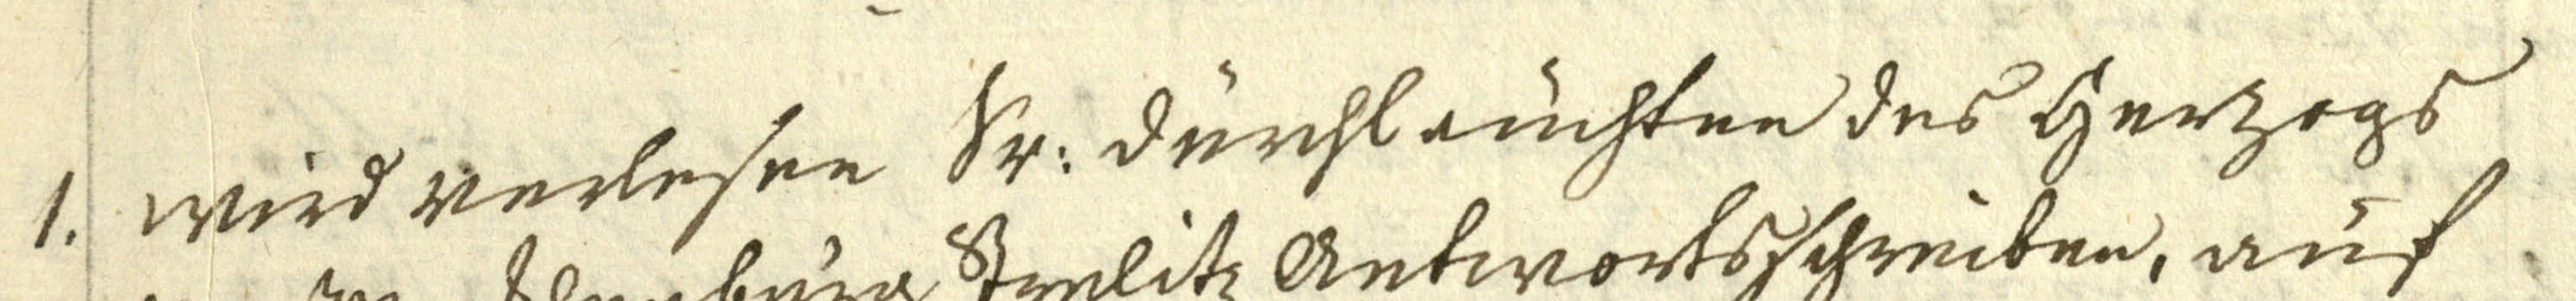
1. Wird verlesen Sr Durchlauchten des Herzogs
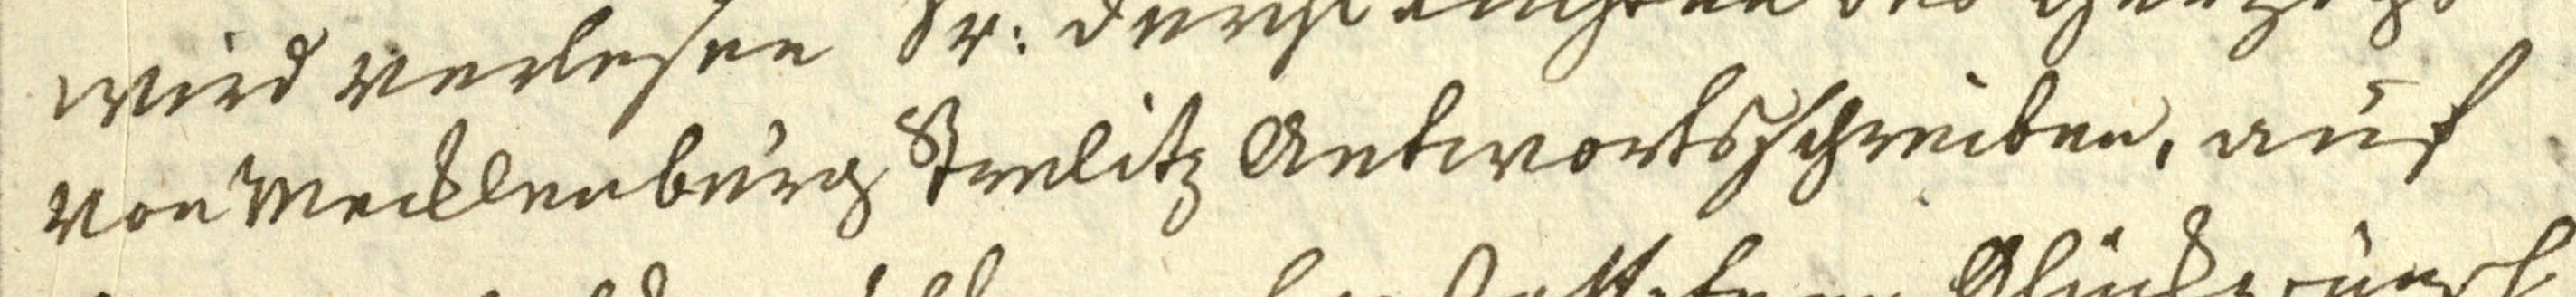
von Mecklenburg Strelitz Antwortsschreiben, auf
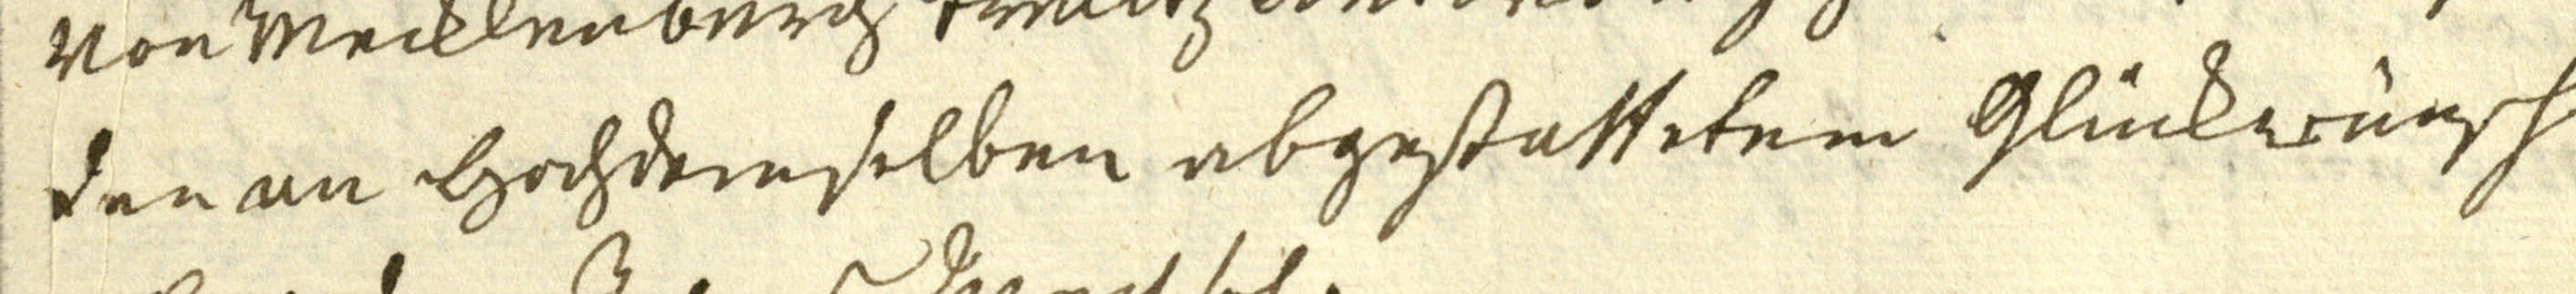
den an Hochdenselben abgestatteten Glückwunsch
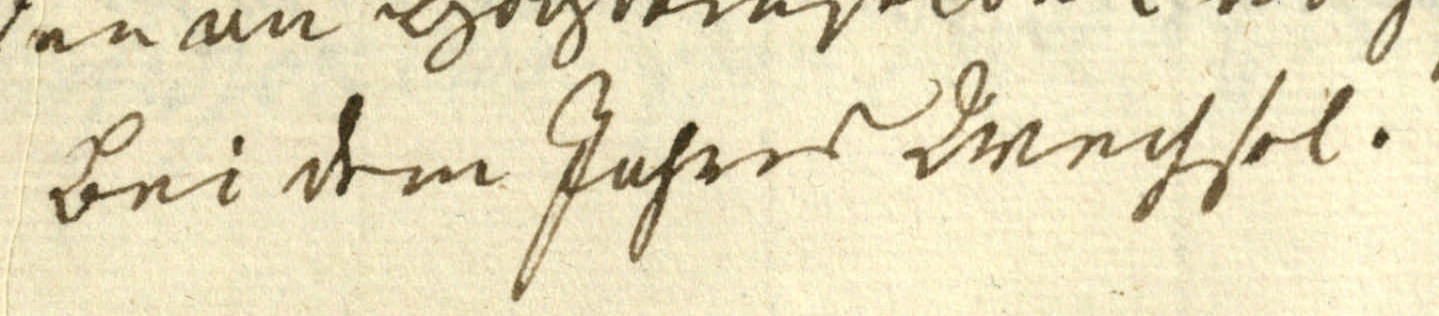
bei dem Jahres Wechsel.
